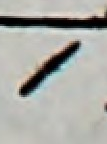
1
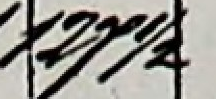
127½
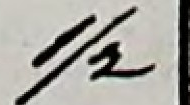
1/2
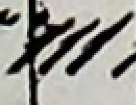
711
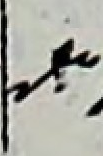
do
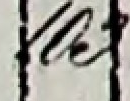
103
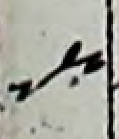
do
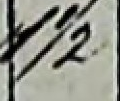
1½
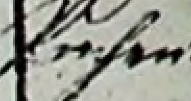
P??sen
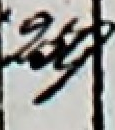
259
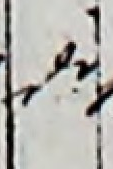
do
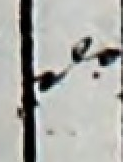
do
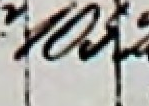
105
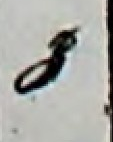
8
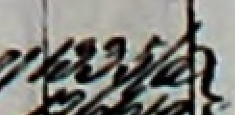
1335/a
